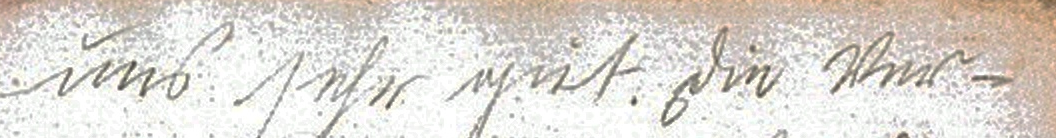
uns sehr gut. Die Ver-
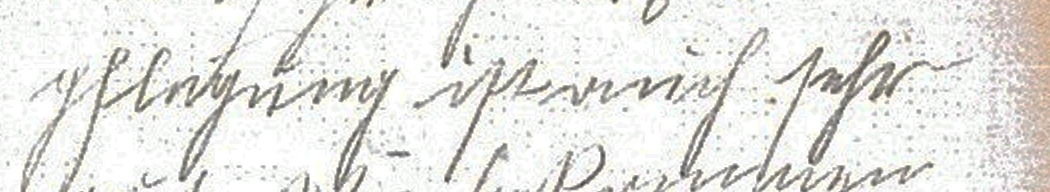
pflegung ist auch sehr
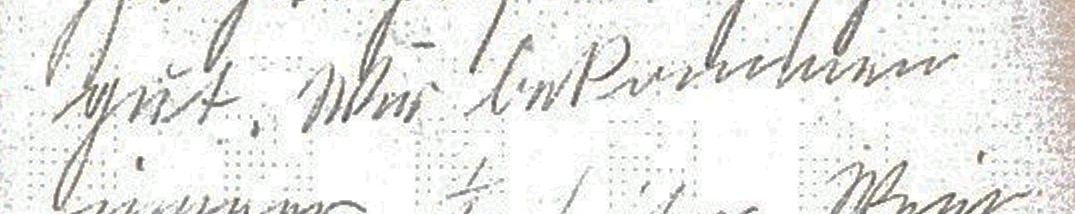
gut. Wir bekommen
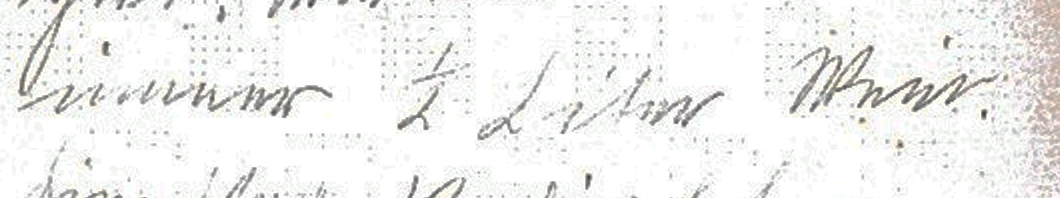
immer 1/2 Liter Wein.
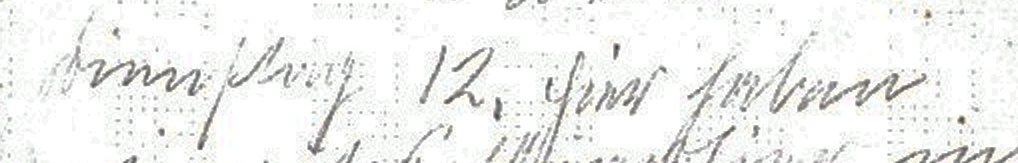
Dienstag 12. Hier haben
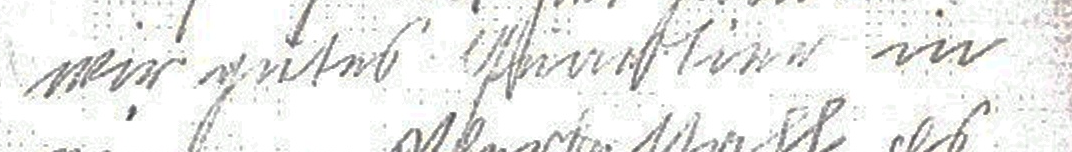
wir gutes Quartier in
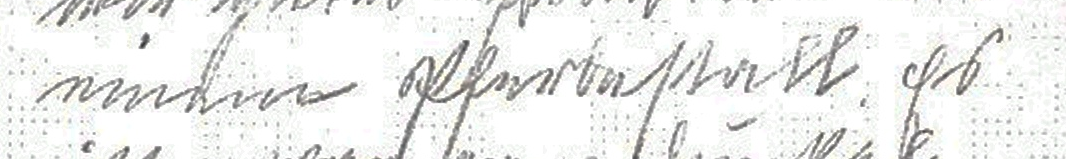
in einem Pferdestall. Es
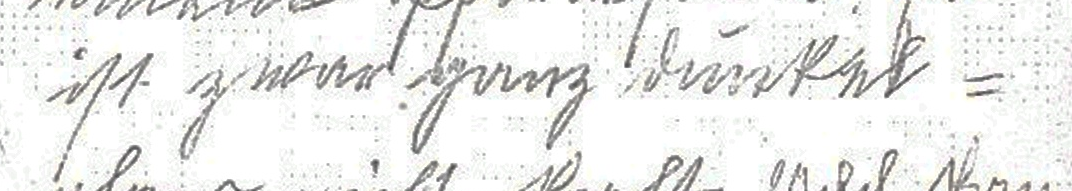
ist zwar ganz dunkel
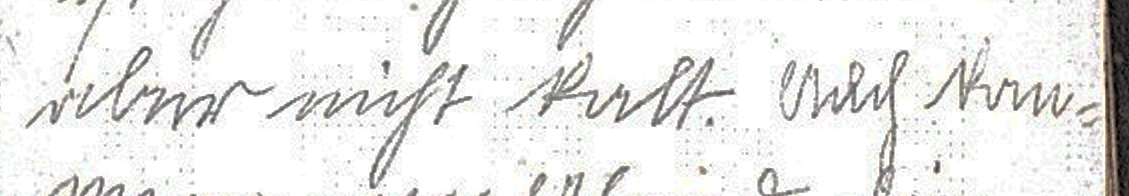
aber nicht kalt. Auch kam-
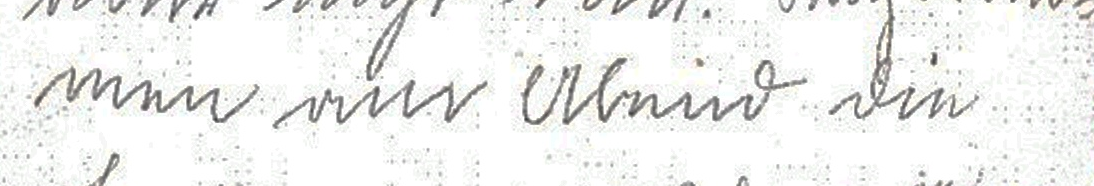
men am Abend die
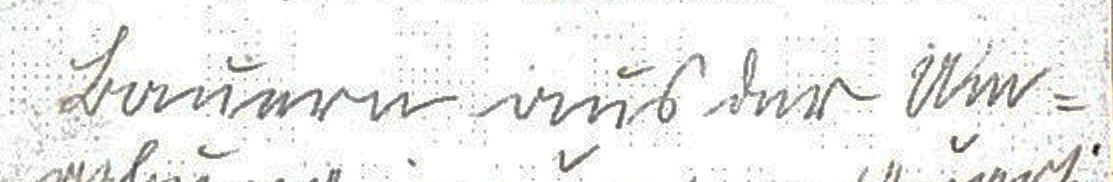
Bauern aus der Um-
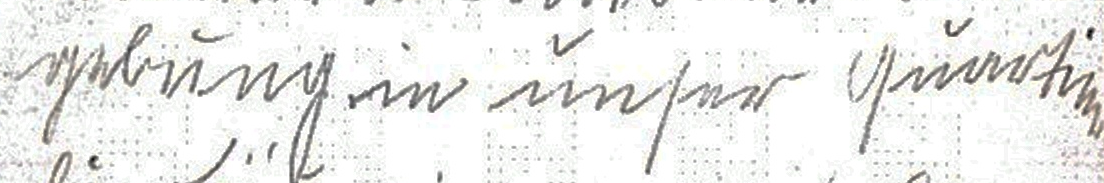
gebung in unser Quartier
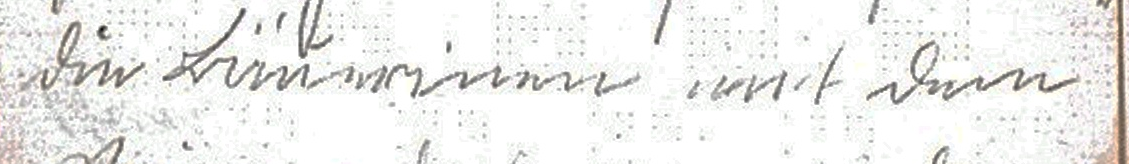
die Bäurinnen mit dem
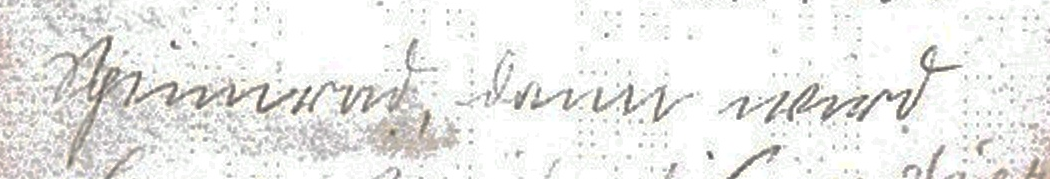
Spinnrad, dann wurd
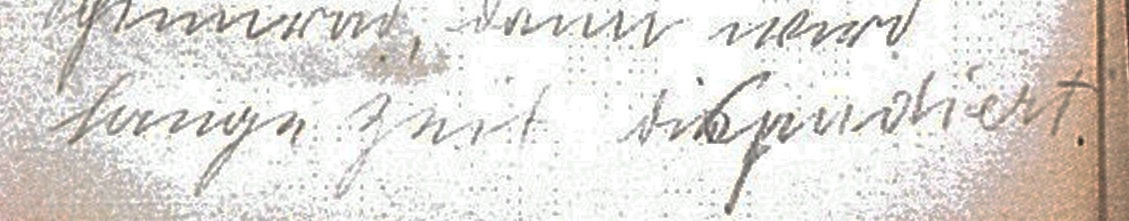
lange Zeit dispudiert.
